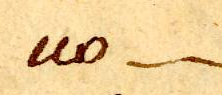us -
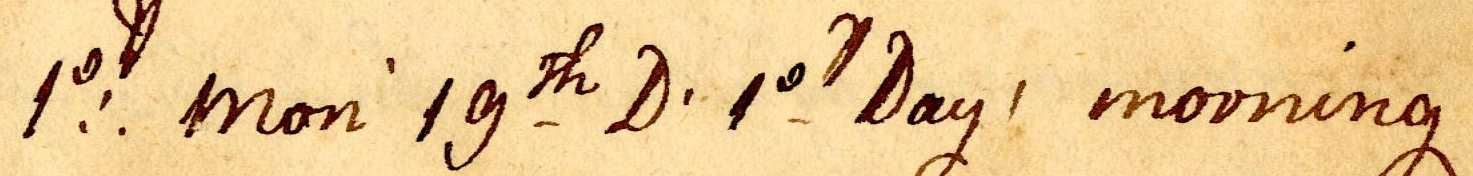1^st . Mon ' 19^th D. 1^st Day' morning
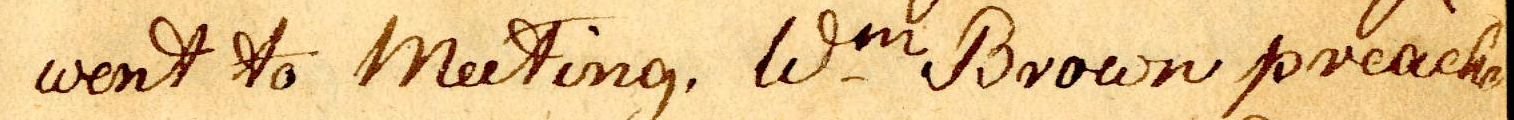went to Meeting, W^m Brown preache
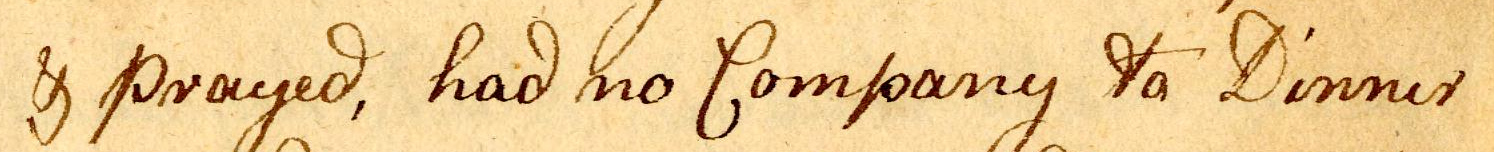& prayed, had no Company to Dinner
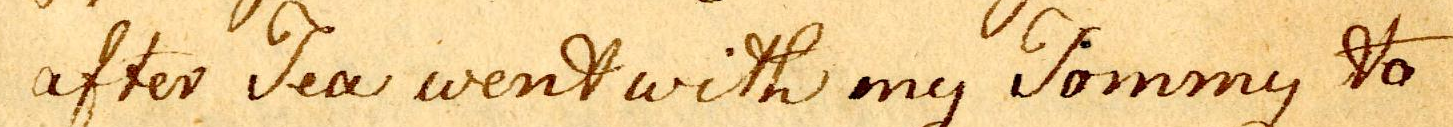after Tea went with my Tommy to
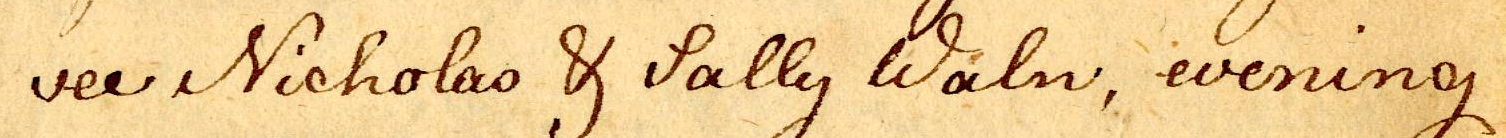see Nicholas & Sally Waln, evening
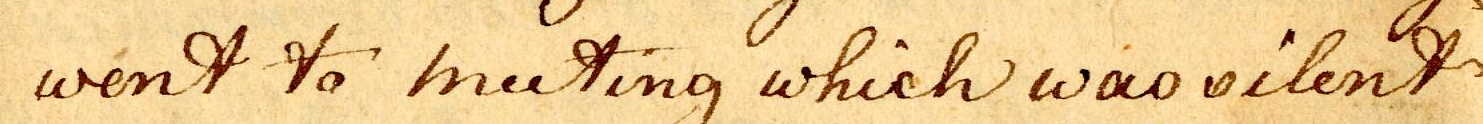went to Meeting which was silent
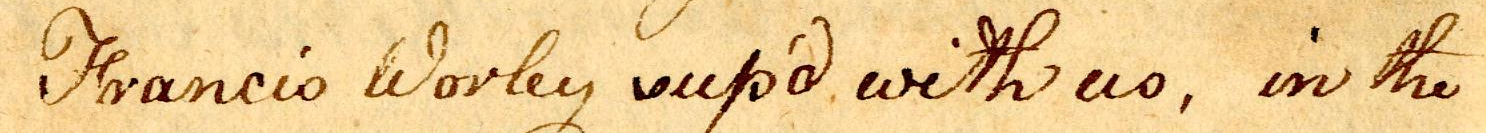Francis Worley sup'd with us, in the
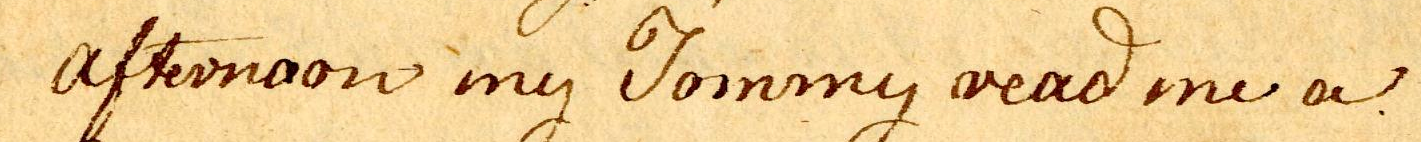Afternoon my Tommy read me a
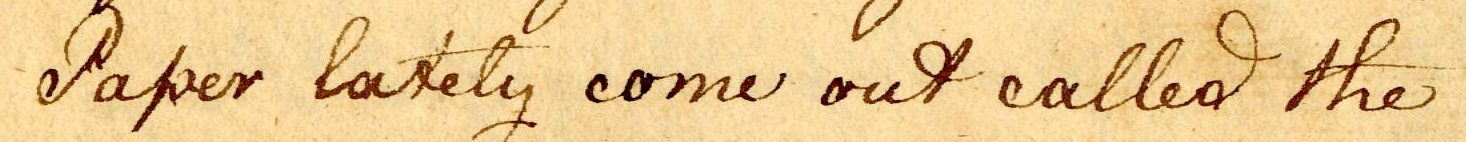Paper lately come out called the
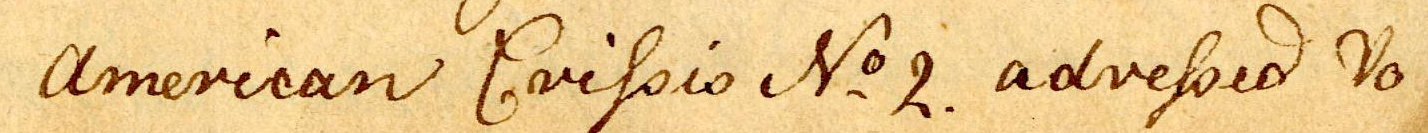American Crissis N^o 2. adressed to
